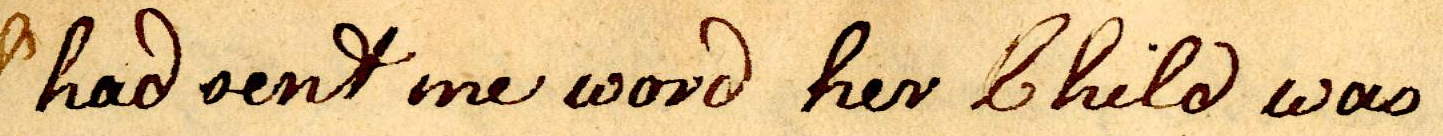had sent me word her Child was
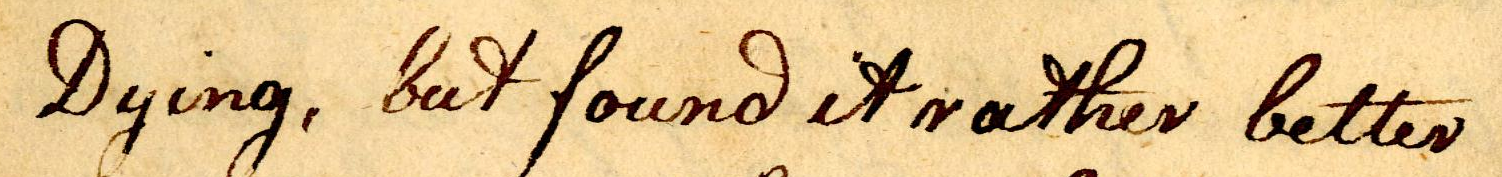Dying, but found it rather better
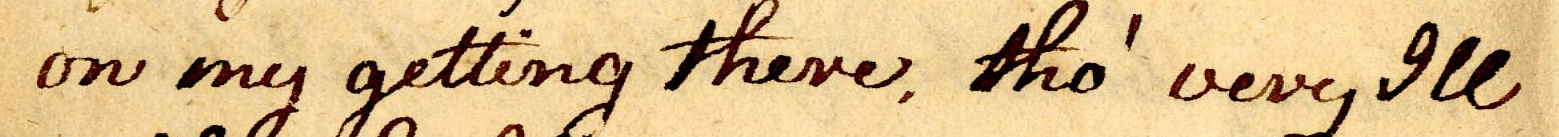on my getting there, tho' very Ill
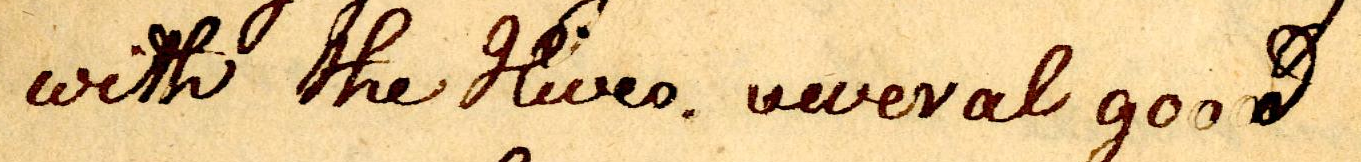with the Hives. several good
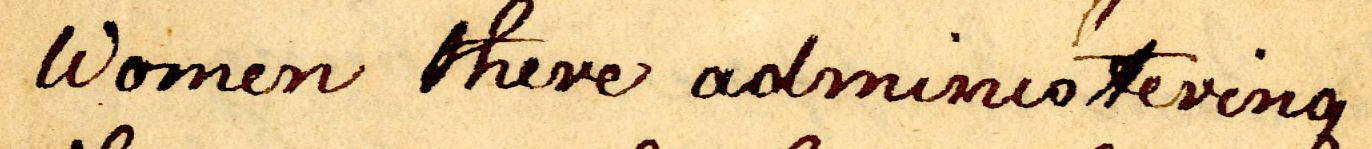Women there administering
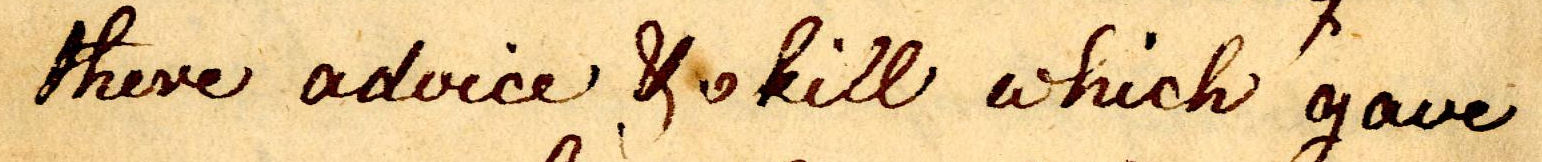there advice & skill which gave
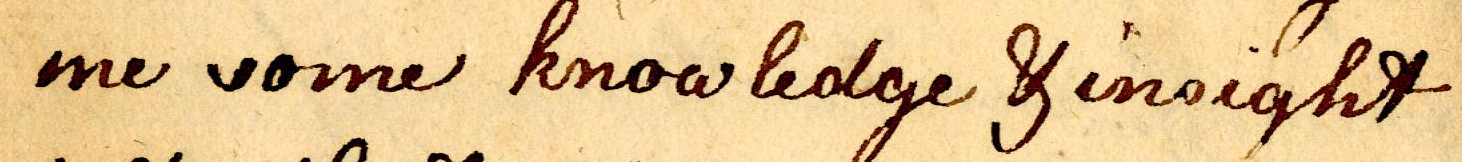me some knowledge & insight
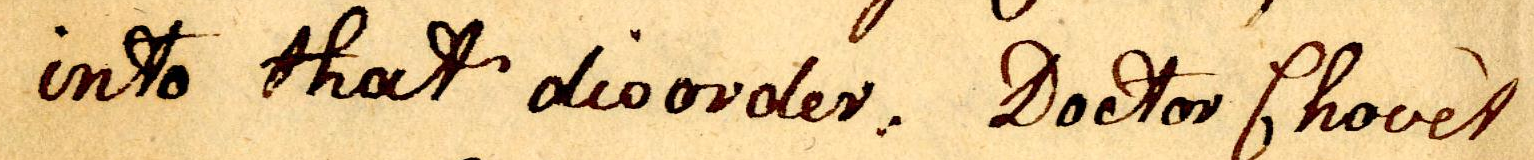into that disorder. Doctor Chovet
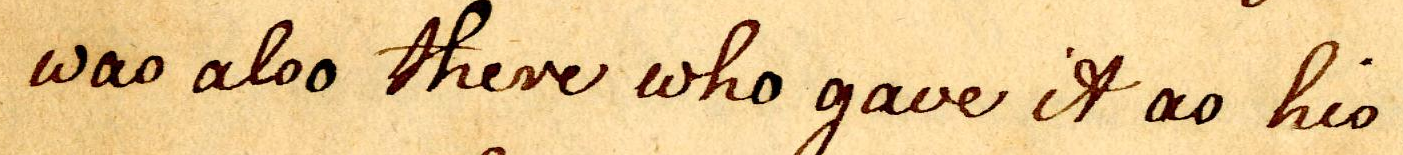was also there who gave it as his
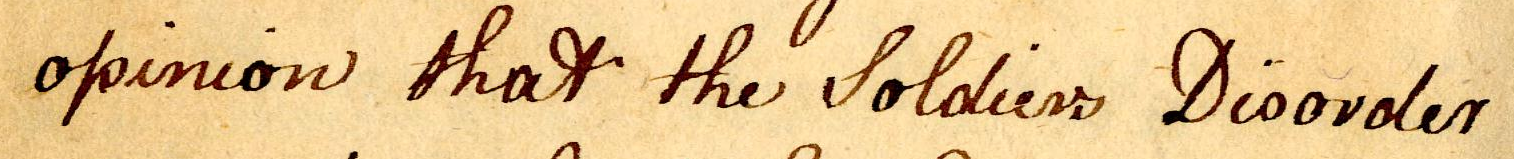opinion that the Soldiers Disorder
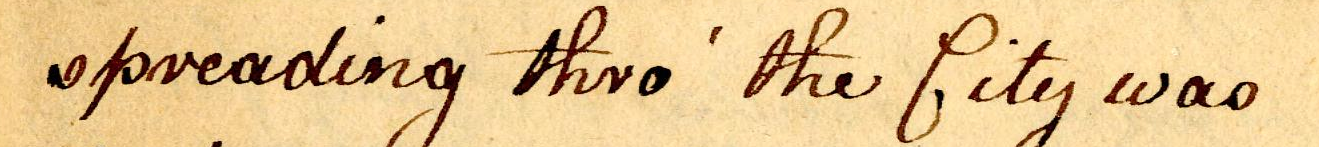spreading thro' the City was
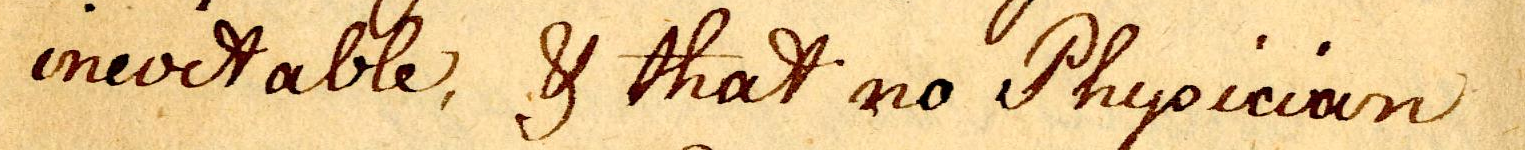inevitable, & that no Physician
